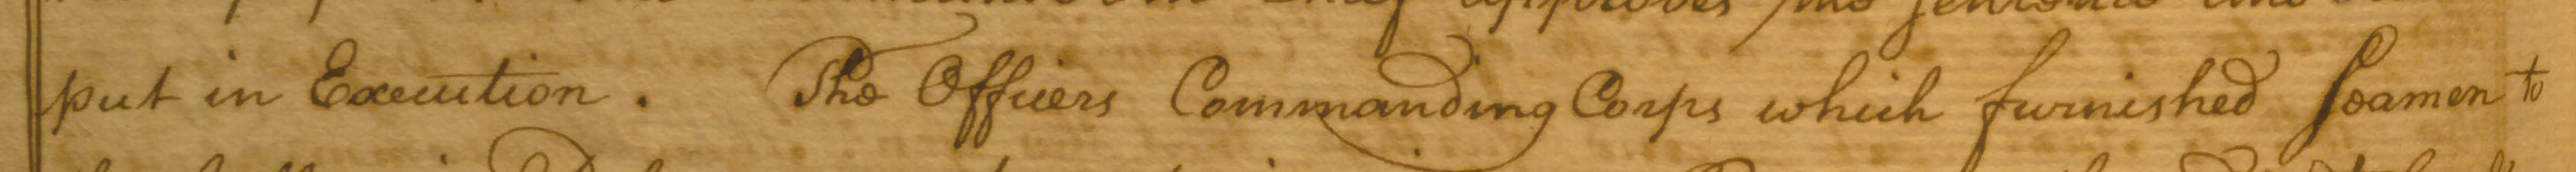put in Execution. The Officers Commanding Corps which furnished Seamen to
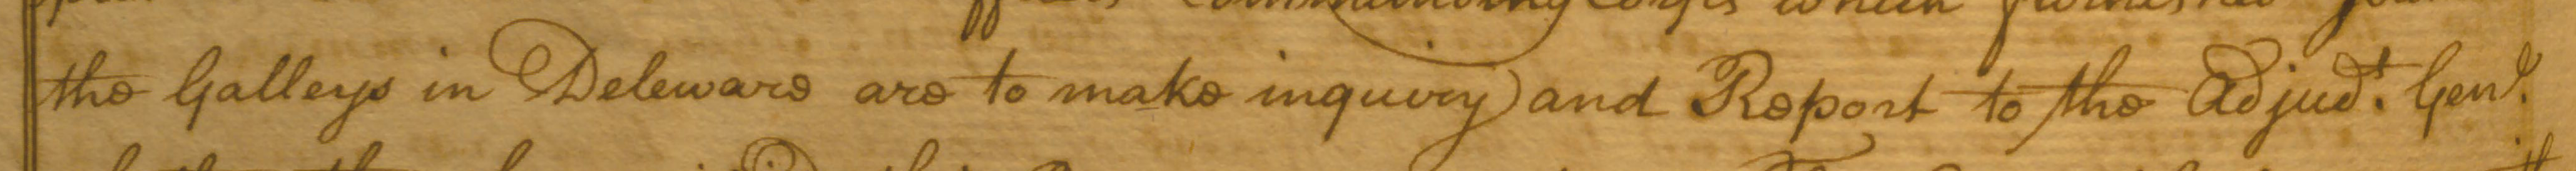the Galleys in Delaware are to make inquiry and Report to the Adjud^t. Gen^l.
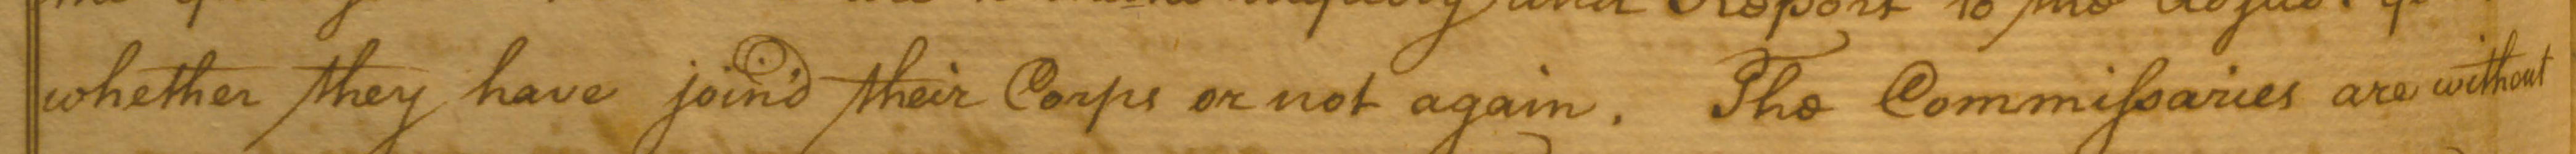whether they have join'd their Corps or not again. The Commissaries are without
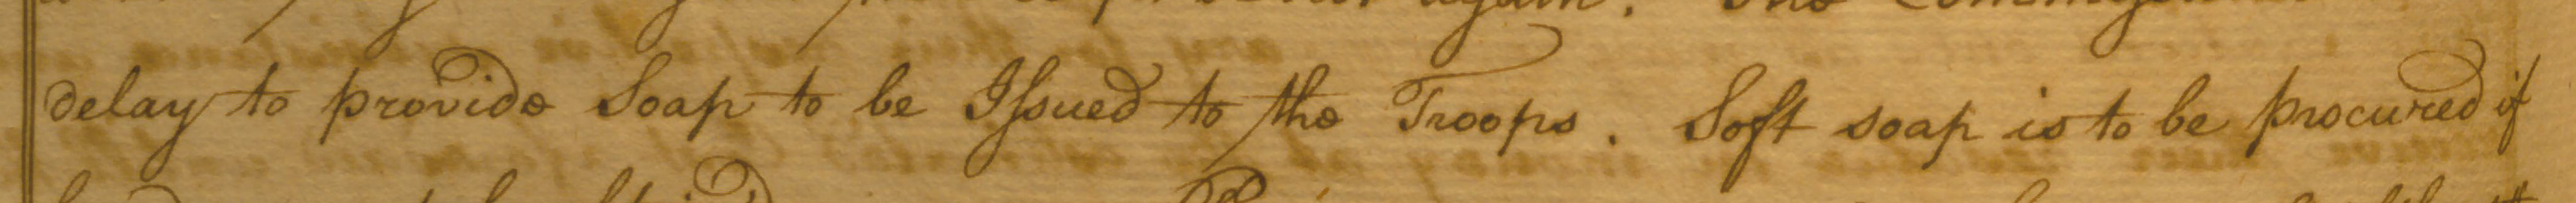delay to provide Soap to be Issued to the Troops. Soft soap is to be procured if
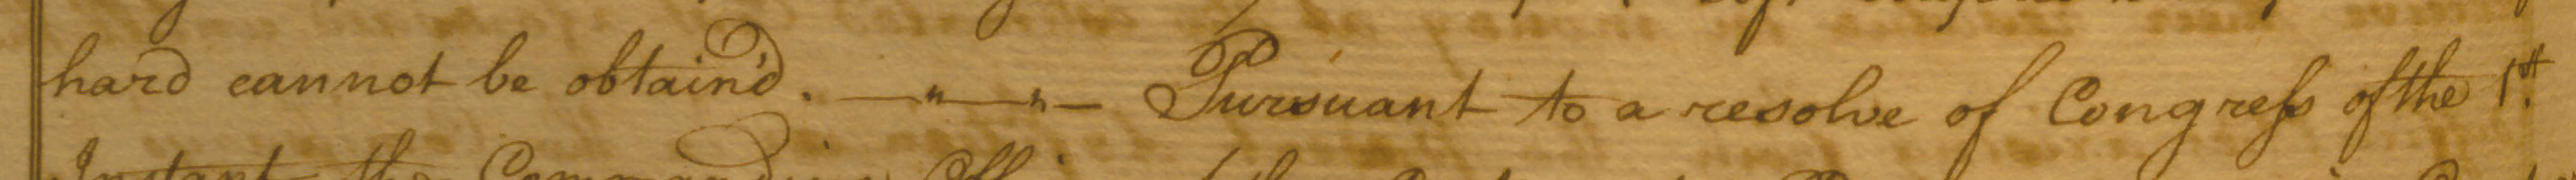hard cannot be obtain'd. -. -. - Pursuant to a resolve of Congress of the 1^st.
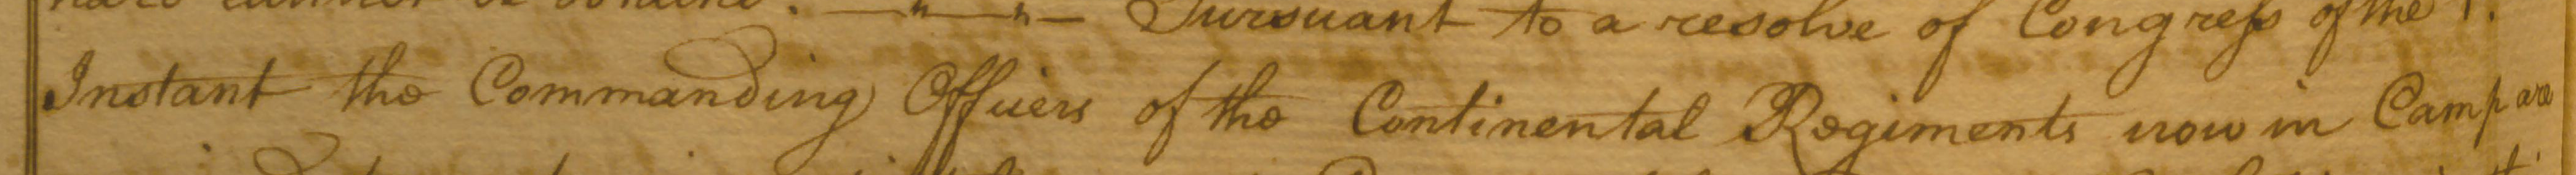Instant the Commanding Officers of the Continental Regiments now in Camp are
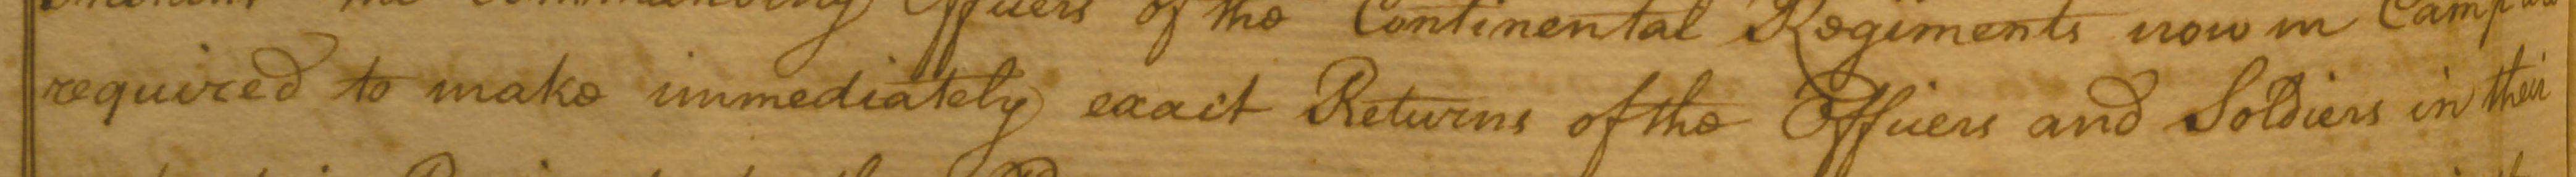required to make immediately exact Returns of the Officers and Soldiers in their
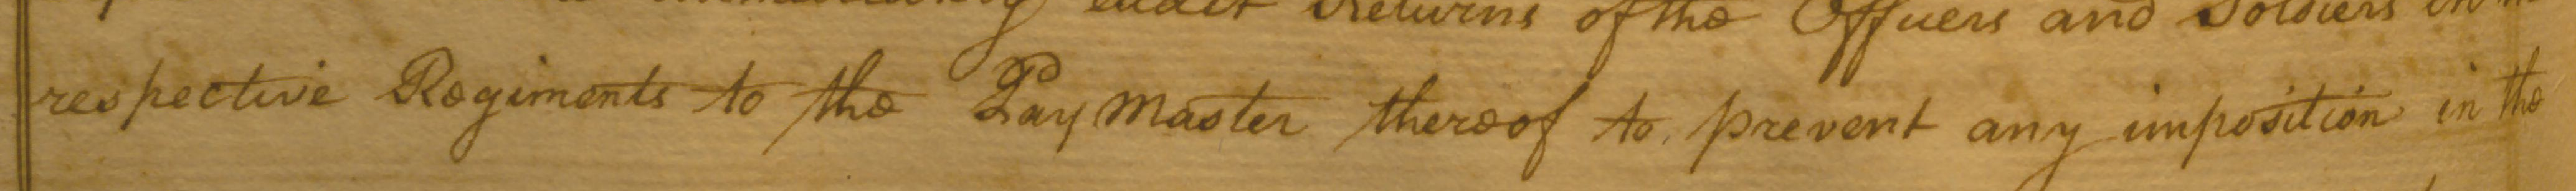respective Regiments to the Pay master thereof to prevent any imposition in the
